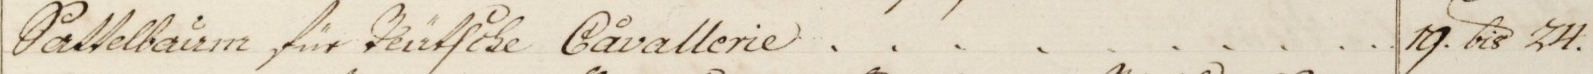Sattelbaum für Teütsche Cavallerie. 19. bis 24.
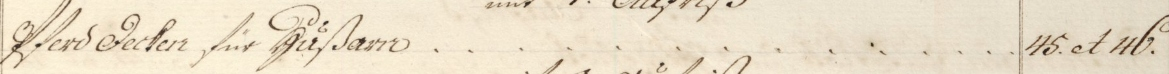Pferd Decken für Hußarn. 45 et 46.
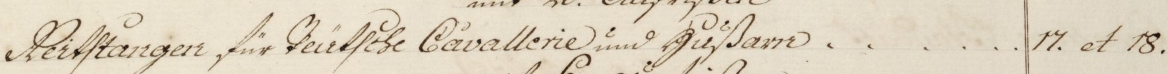Reitstangen für Teütsche Cavallerie und Hußarn. 17. et 18.
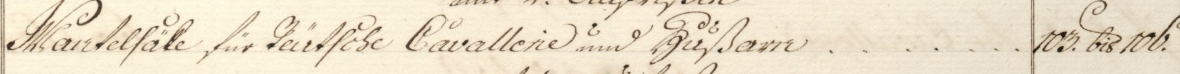Mantelsäke für Teütsche Cavallerie und Hußarn. 103. bis 106.
